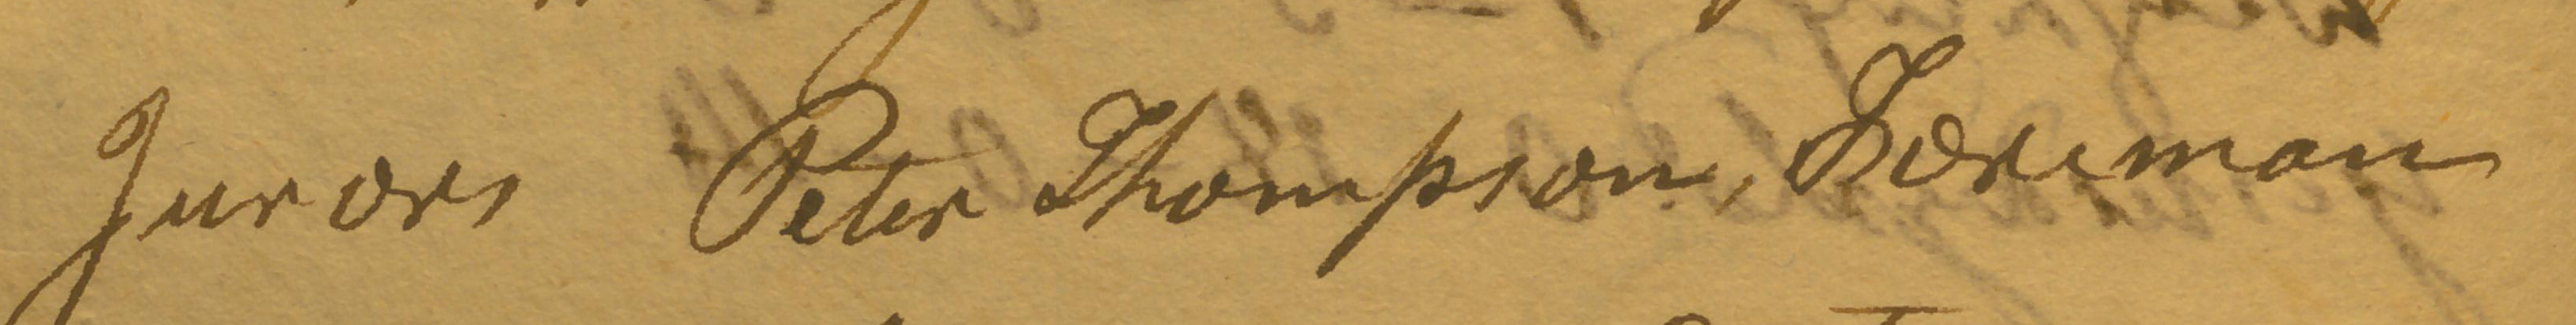Jurors Peter Thompson, Foreman
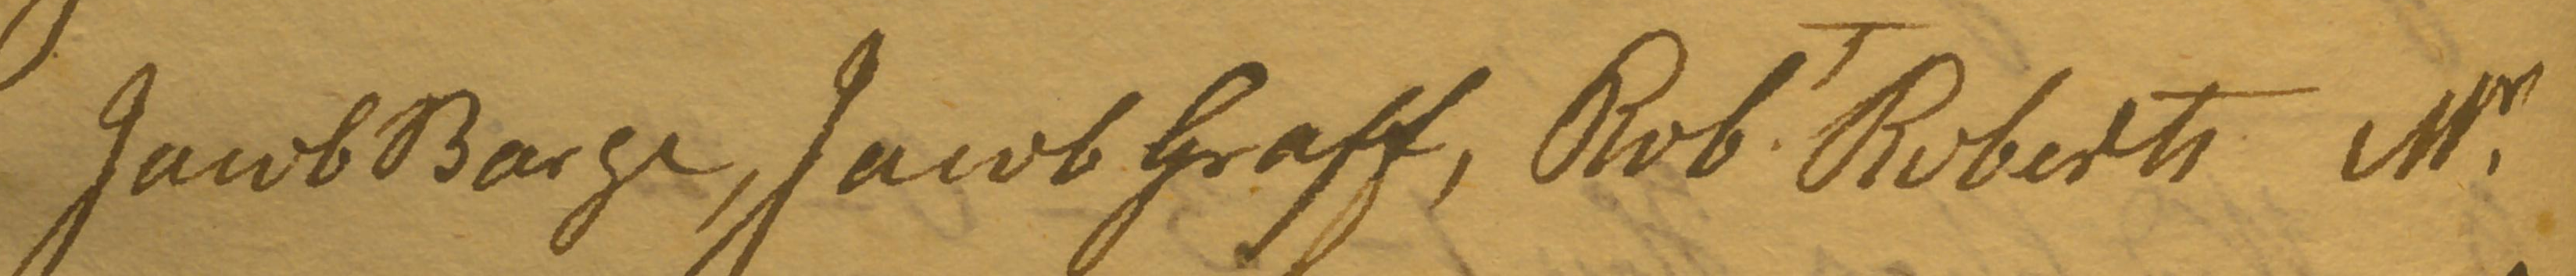Jacob Barge, Jacob Graff, Rob^t. Roberts M^r.
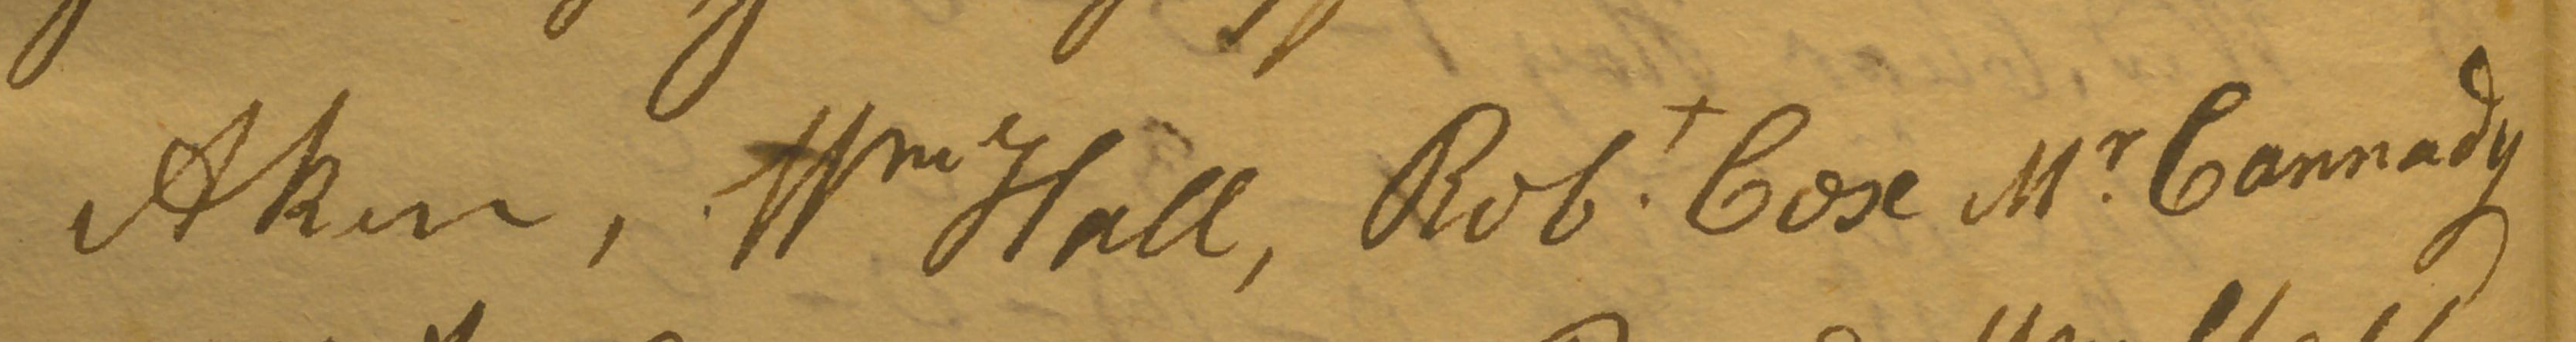Akin, W^m Hall, Rob^t. Cox M^r. Cannady
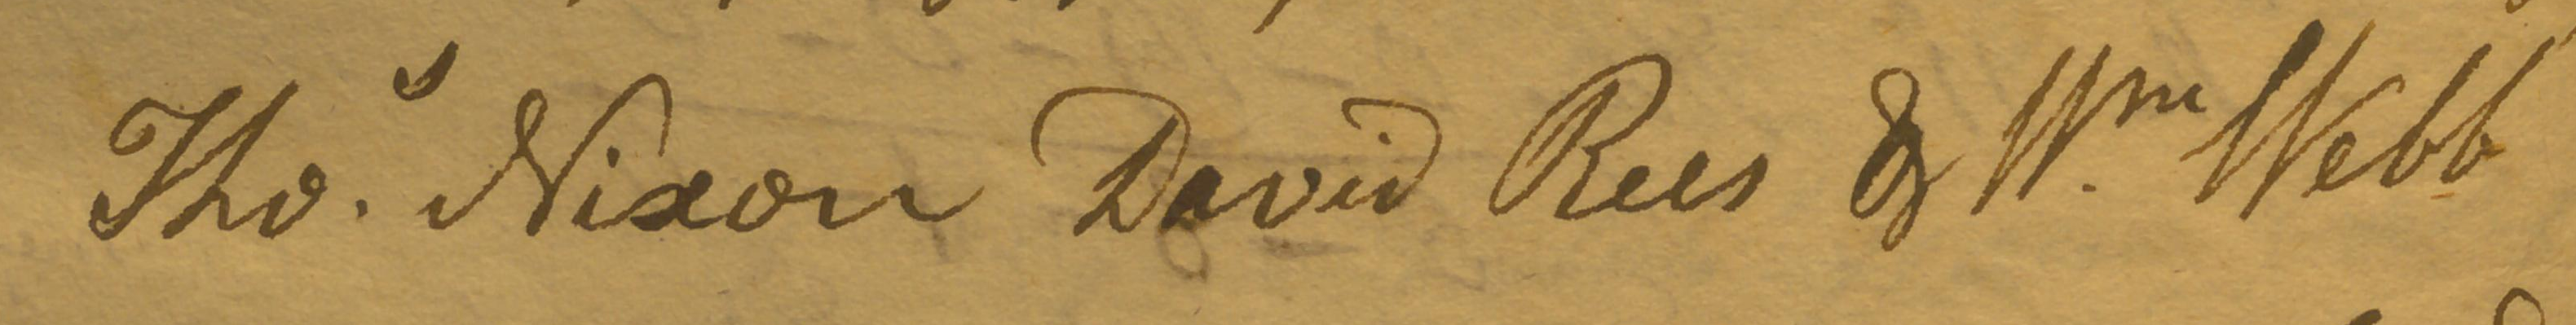Tho^s. Nixon David Rees & W^m. Webb
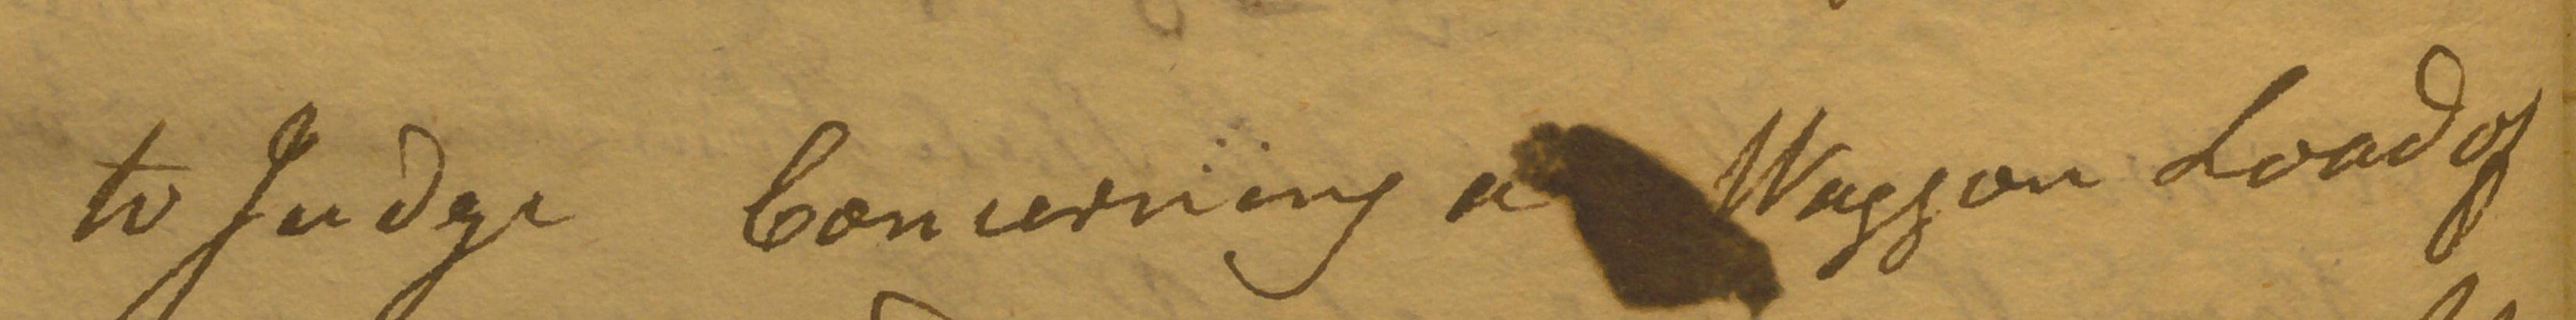to Judge Concerning a Waggon Load of
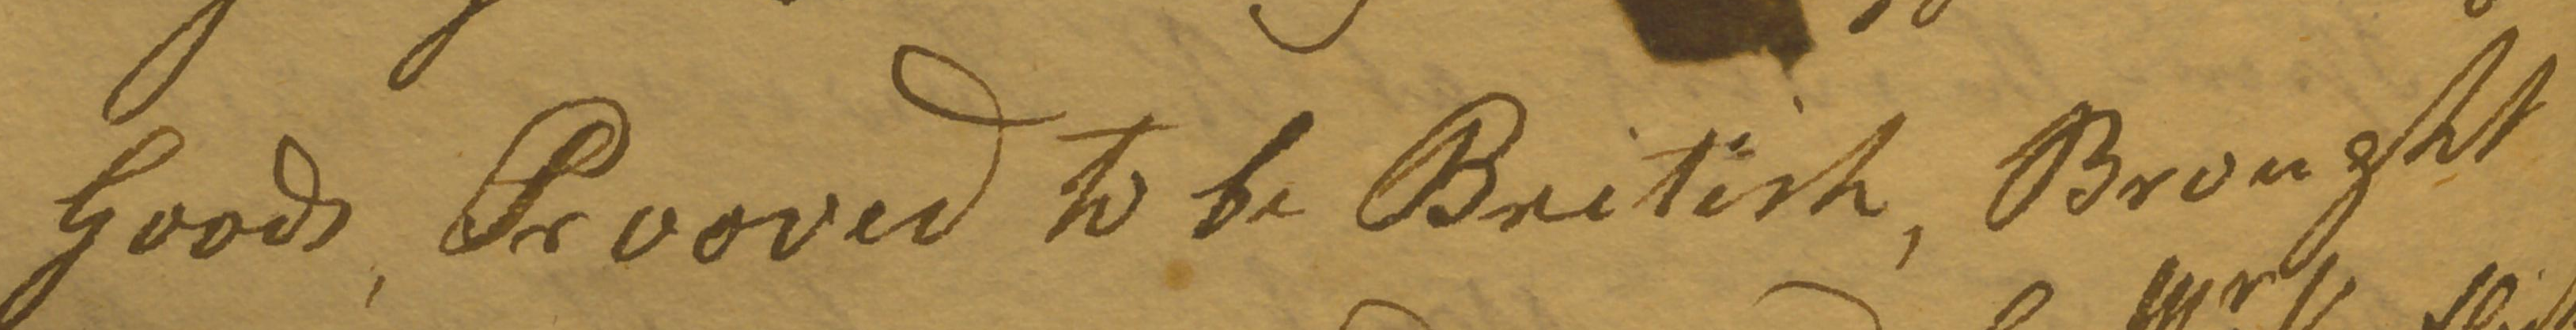Goods Prooved to be British Brought
